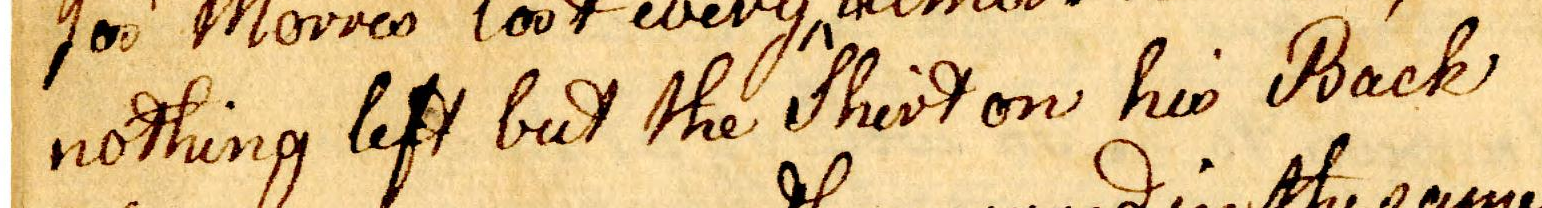nothing left but the Shirt on his Back
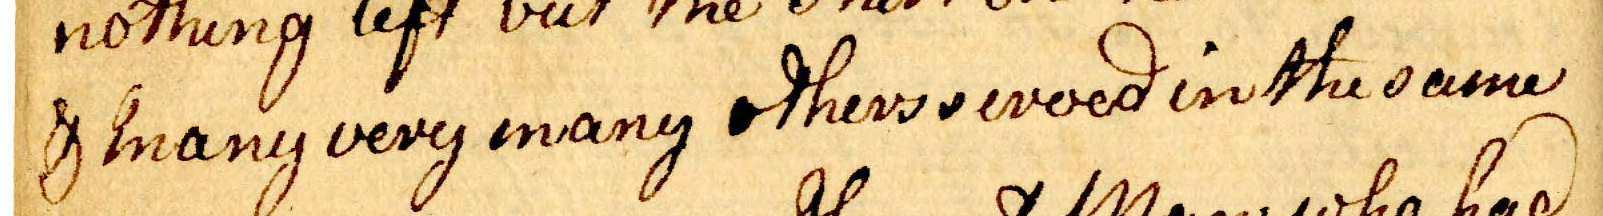& many very many others served in the same
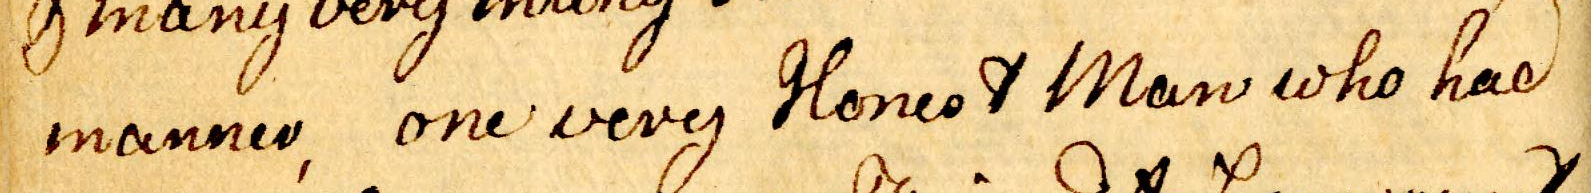manner. one very Honest Man who had
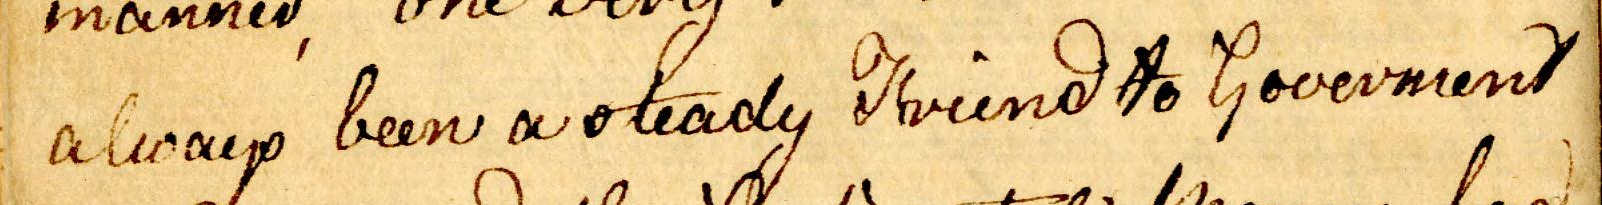always been a steady Friend to Goverment
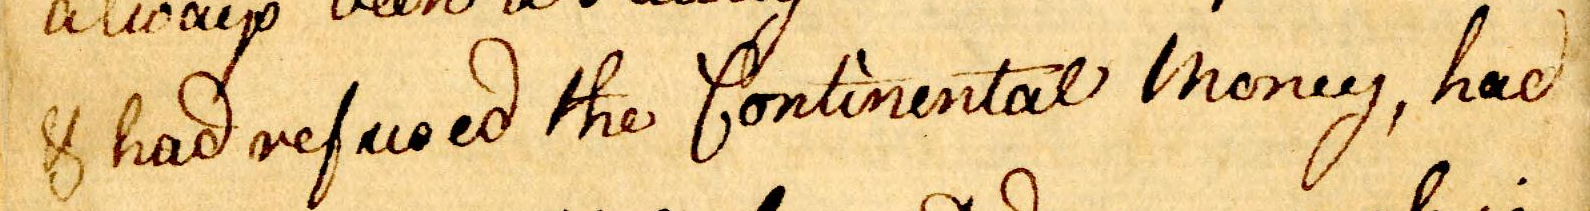& had refused the Continental Money, had
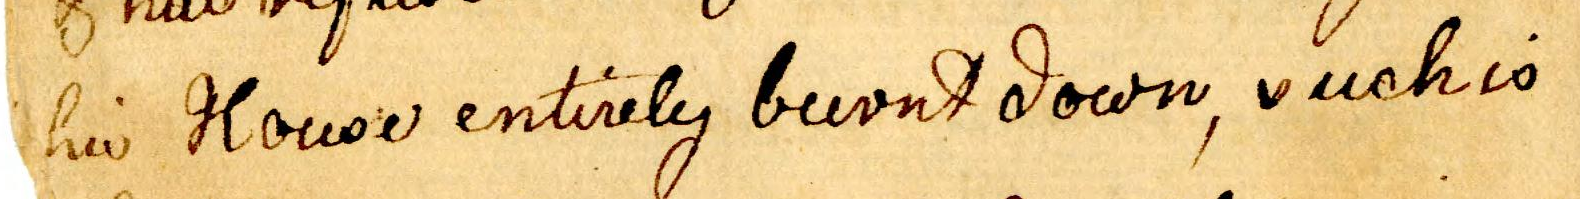his House entirely burnt down, such is
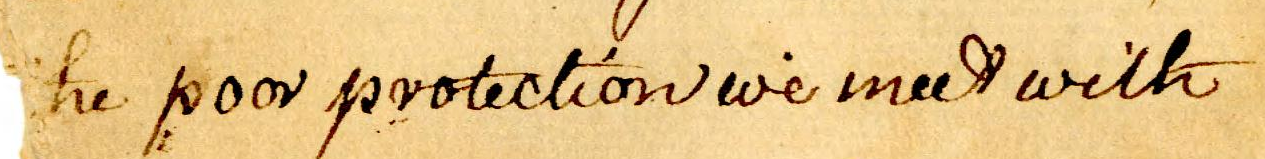he poor protection we meet with
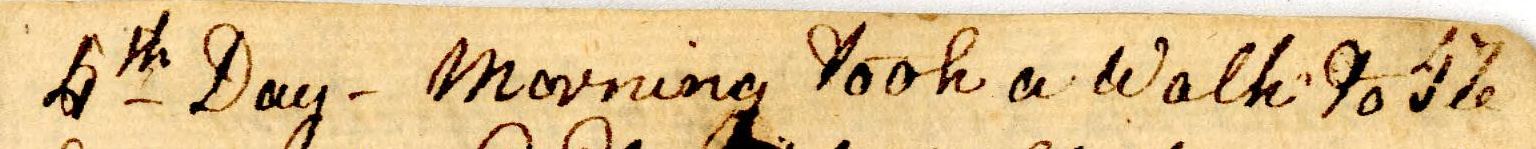4^th Day- Morning took a Walk see ^47
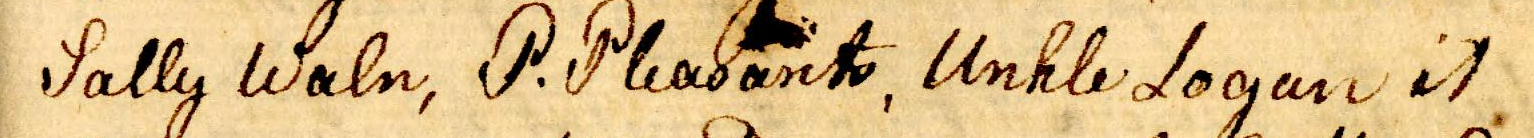Sally Waln, P. Pleasants, Unkle Logan it
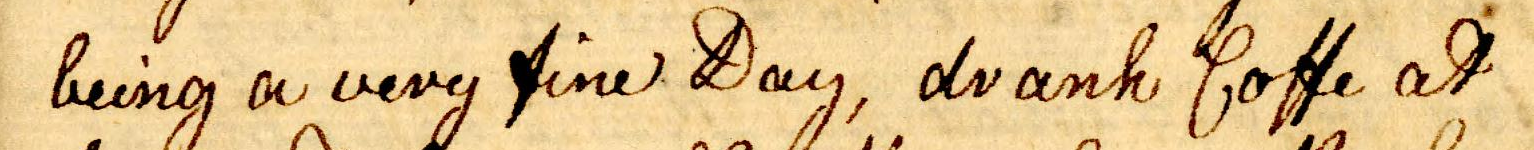being a very fine Day, drank Coffe at
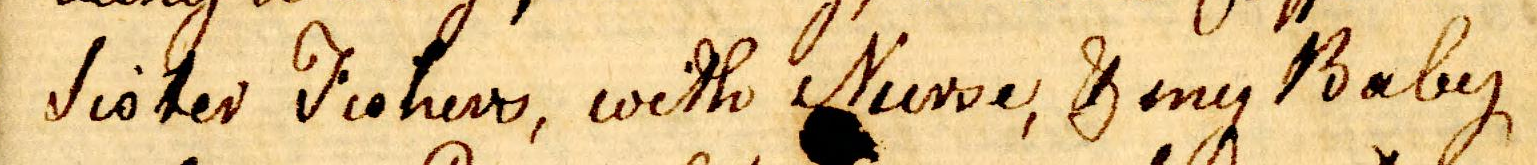Sister Fishers, with Nurse, & my Baby
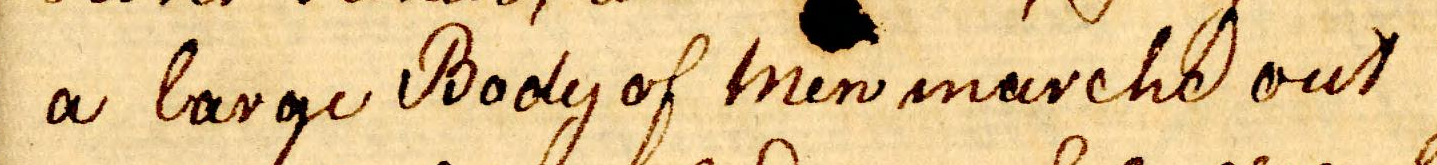a large Body of Men marchd out
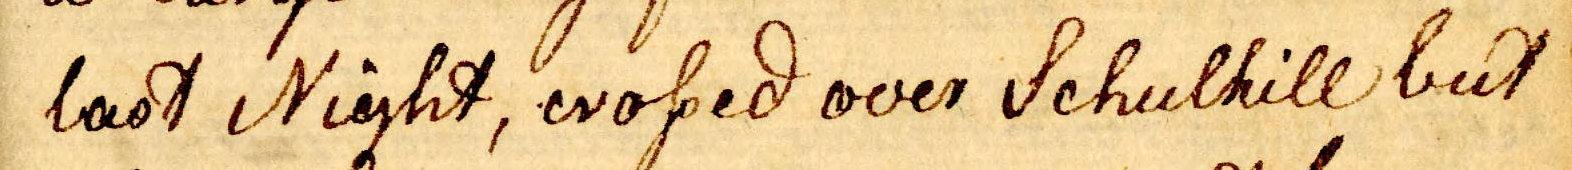last Night, crossed over Schulkill but
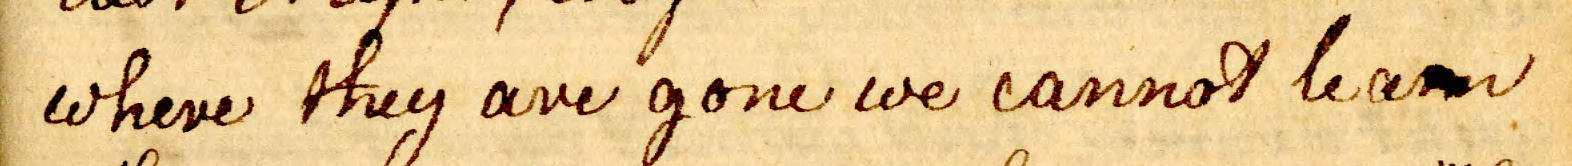where they are gone we cannot learn
